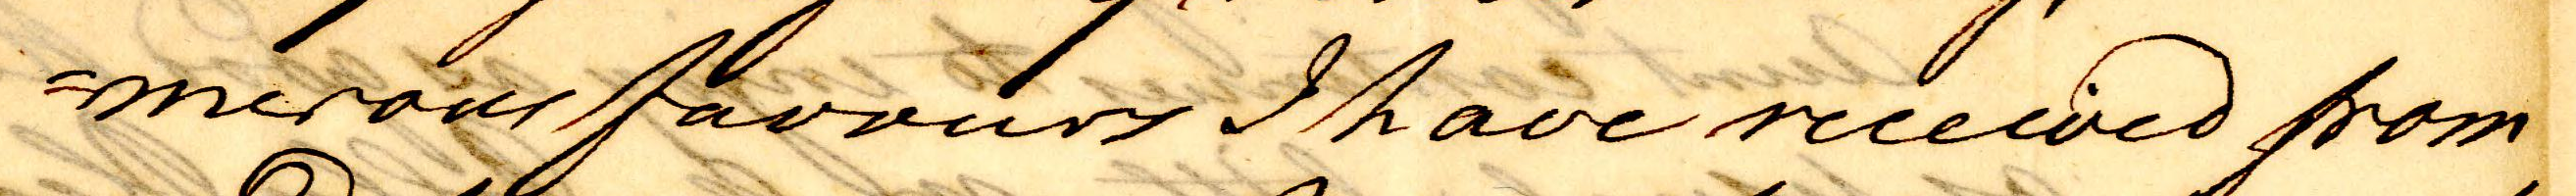-merous favours I have received from
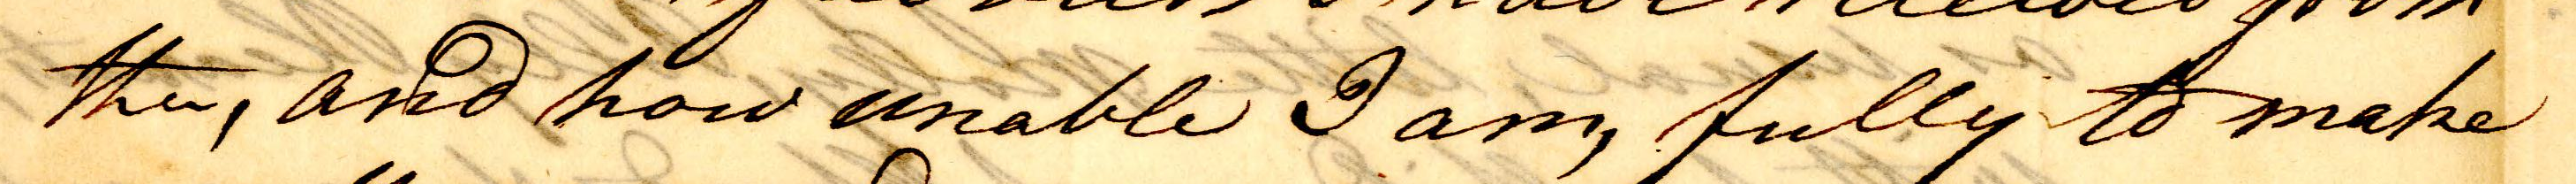thee, and how unable I am, fully to make
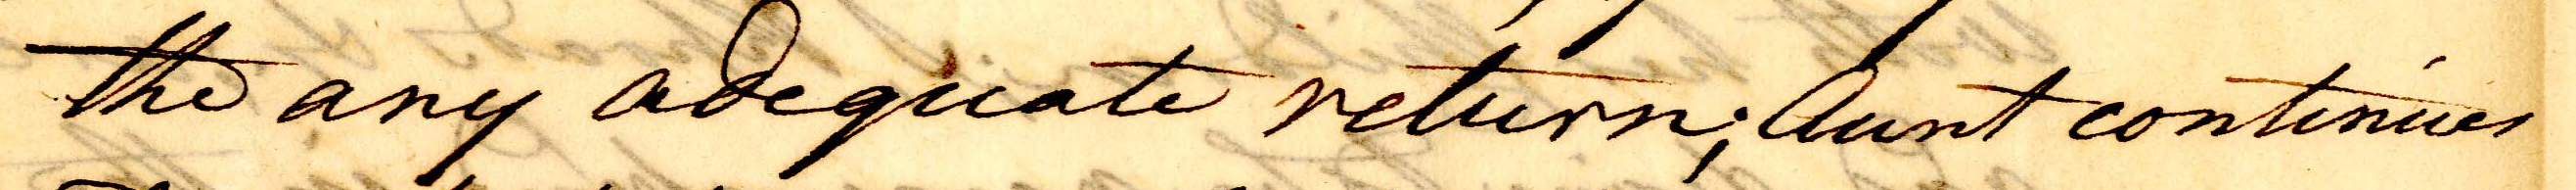the any adequate return; Aunt continues
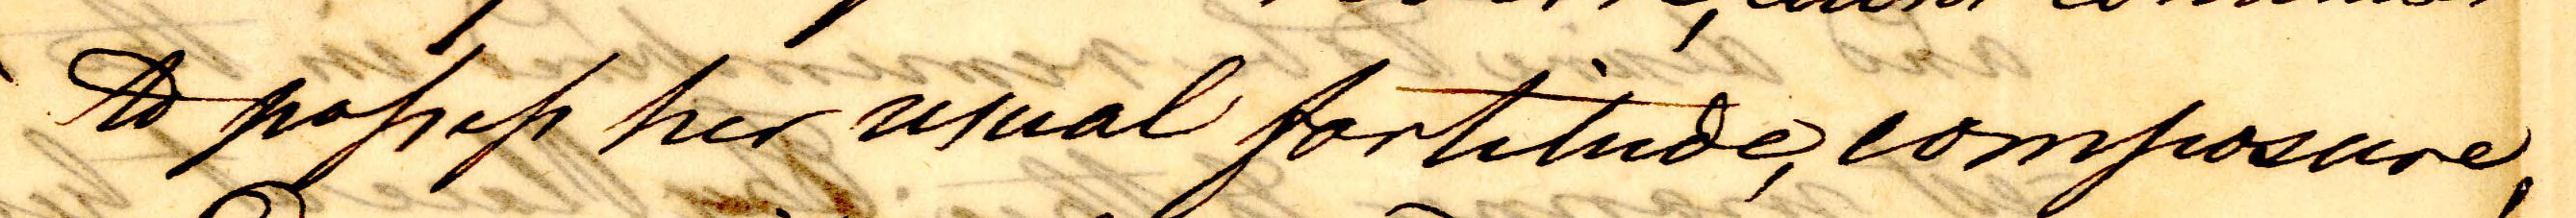to profess her usual fortitude, composure,
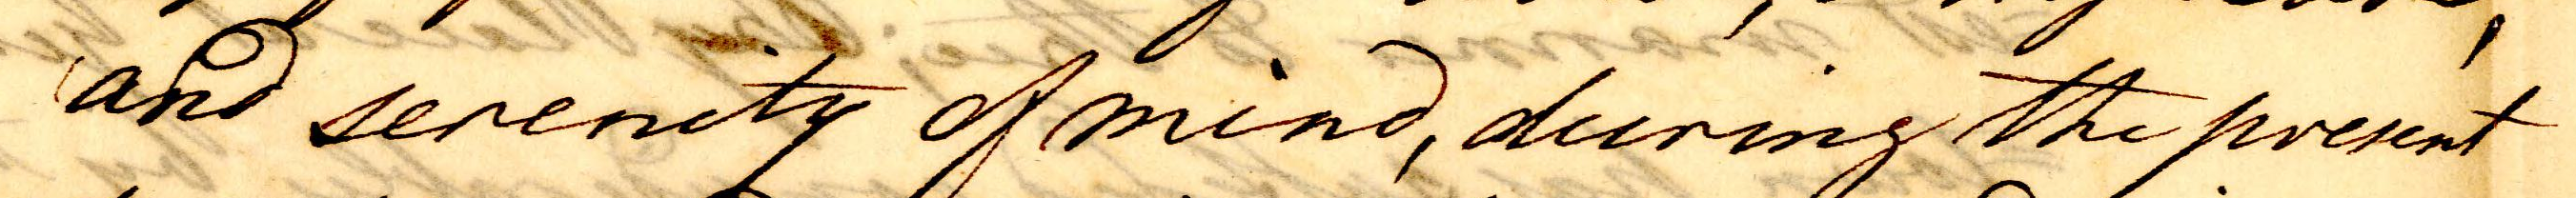and serenity of mind, during the present
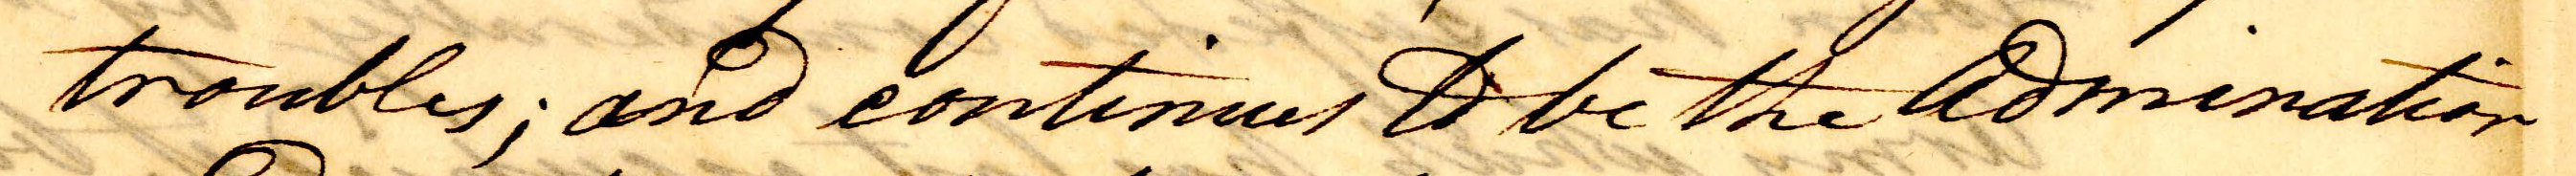troubles; and continues to be the Admiration
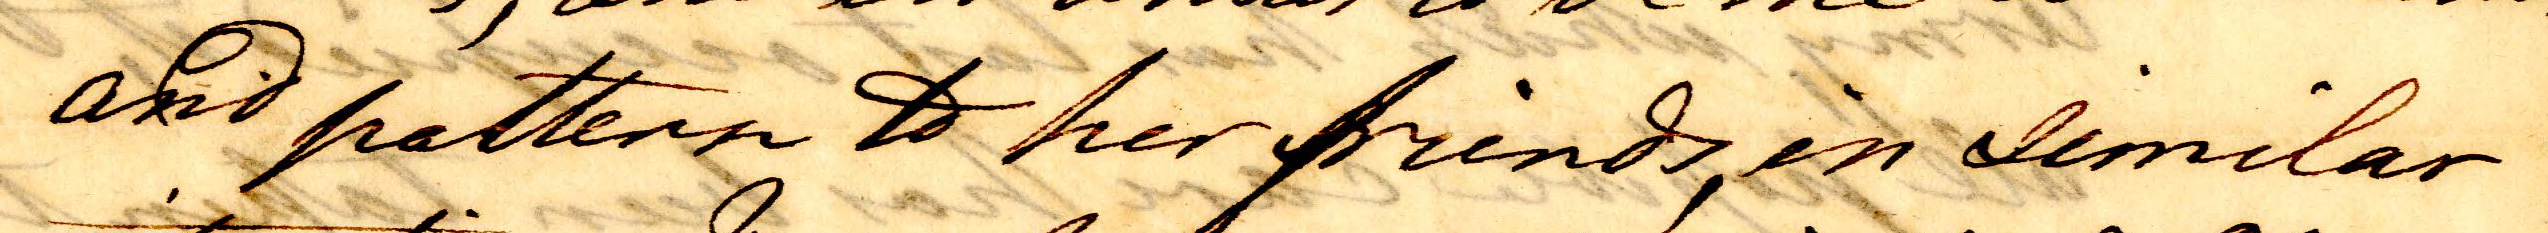and pattern to her friends, in similar
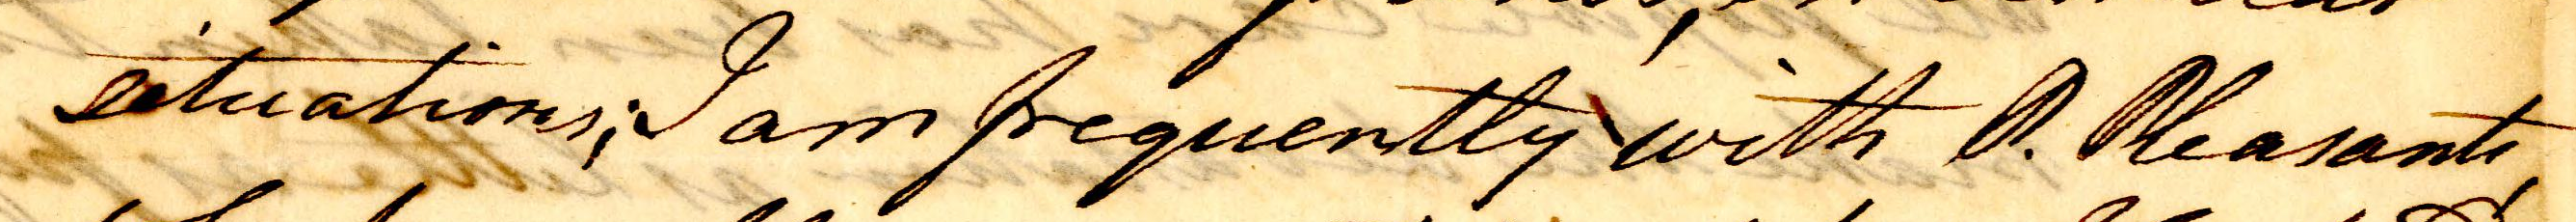situations; I am frequently with P. Pleasants
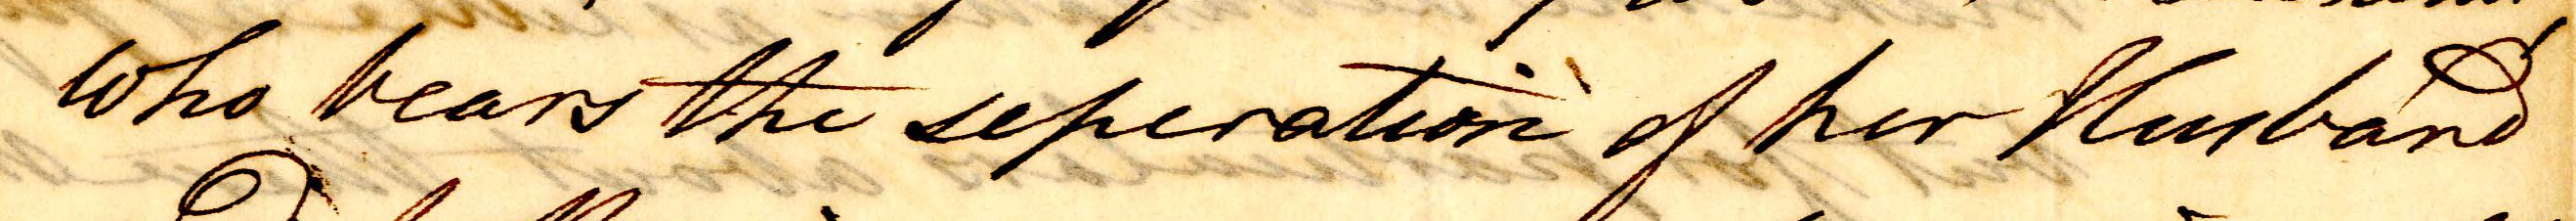who bears the seperation of her Husband
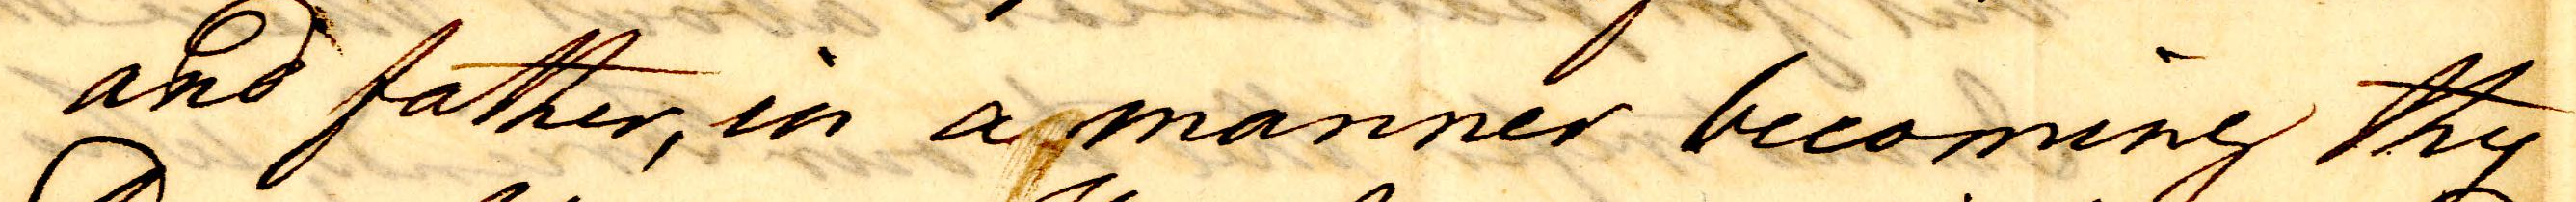and father, in a manner becoming thy
